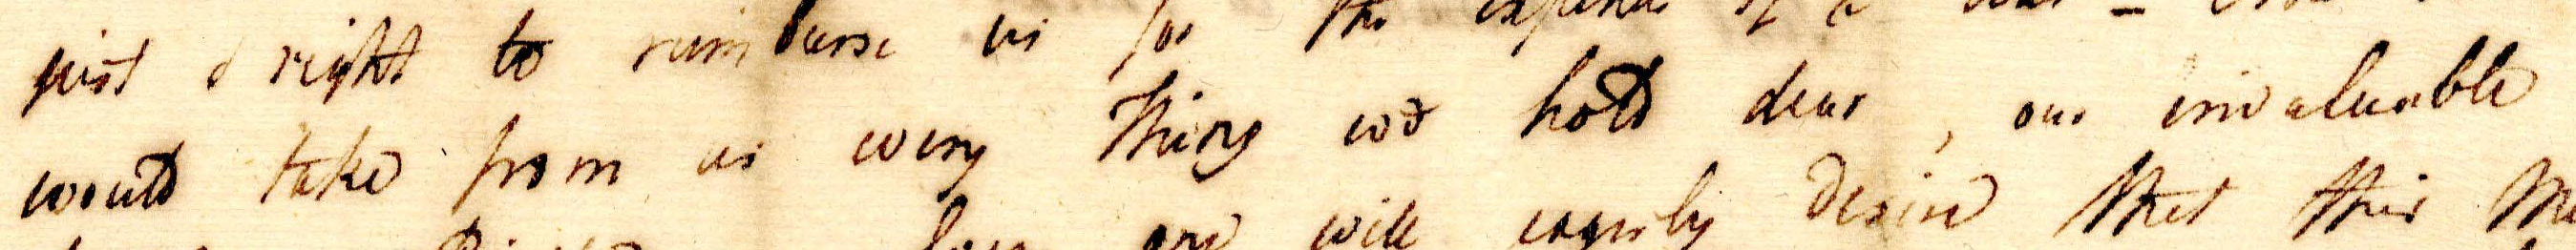would take from us every Thing we hold dear, our invaluable
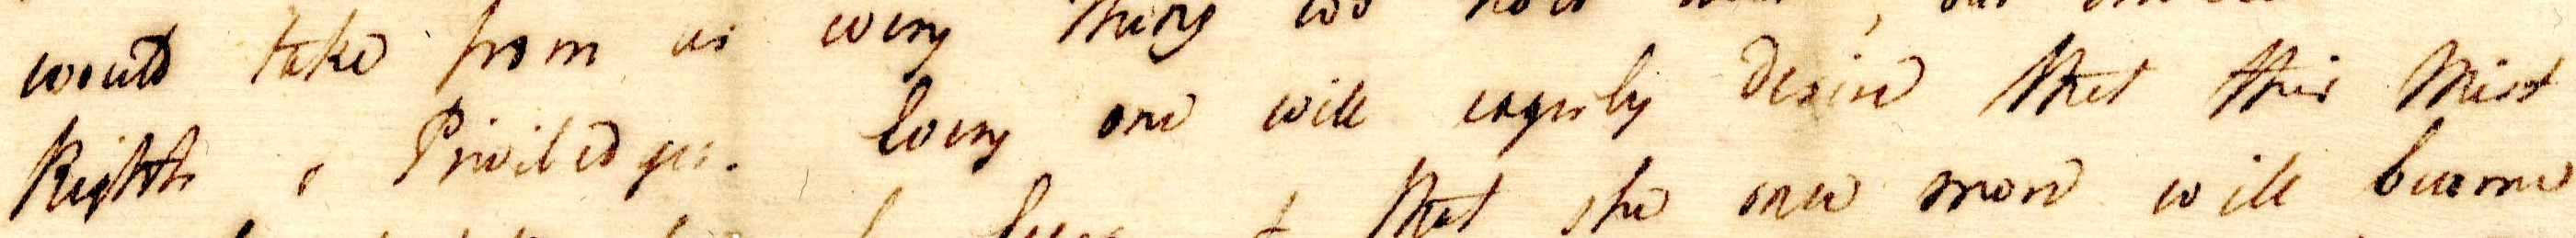Rights & Priviledges. Every one will eagerly desire that this Mist
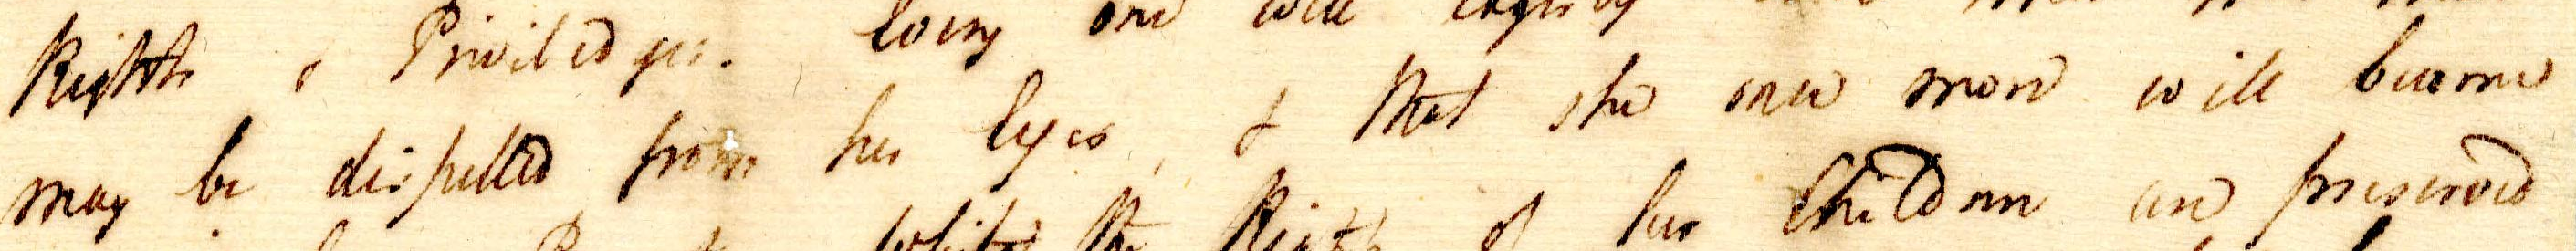may be dispelled from her Eyes, & that she once more will become
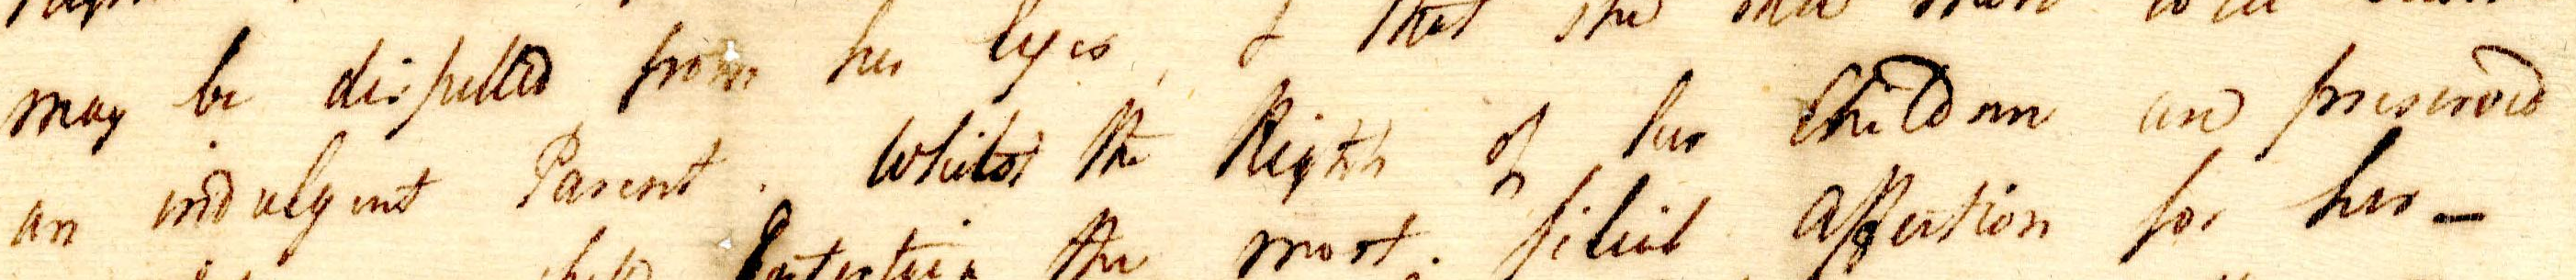an indulgent Parent whilst the Rights of her Children are preserved
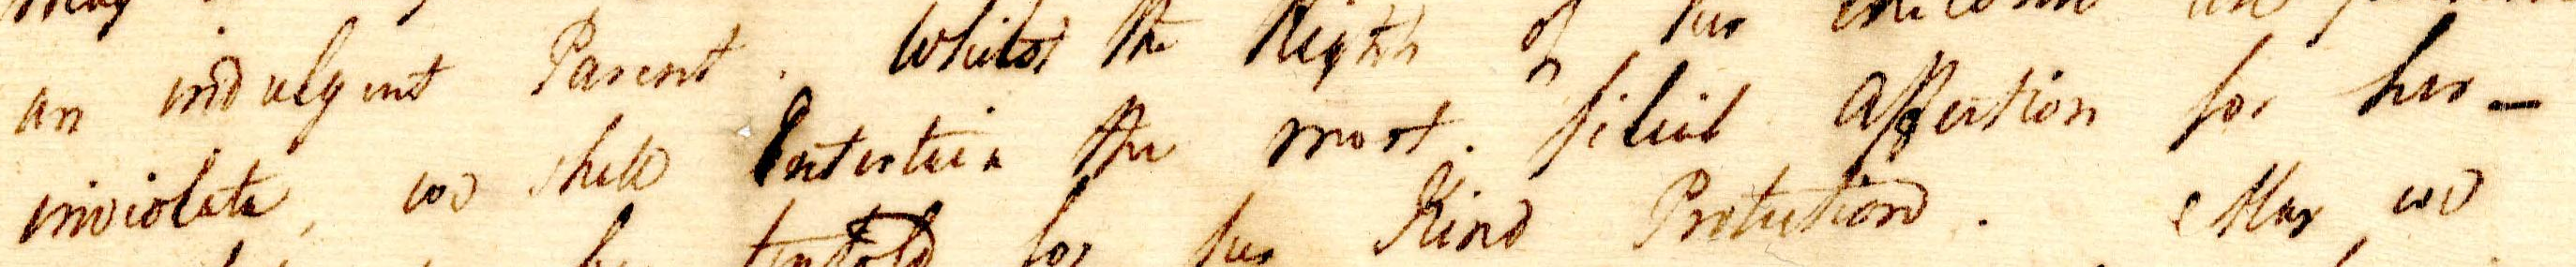inviolate we shall Entertain the most filial Affection for her.
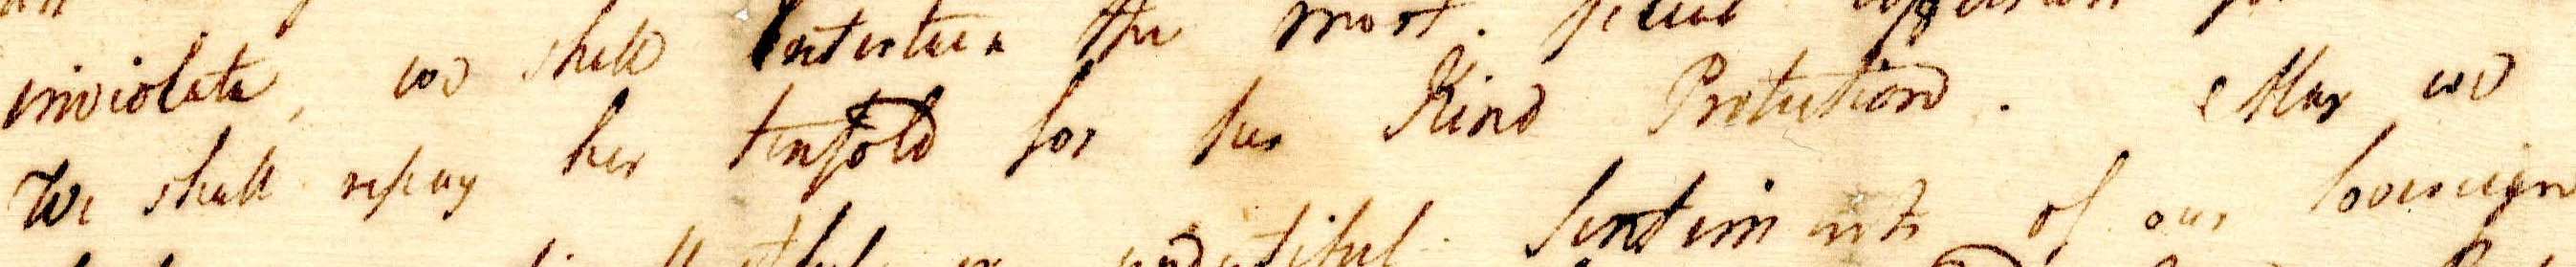We shall repay her tenfold for her Kind Pretention. May we
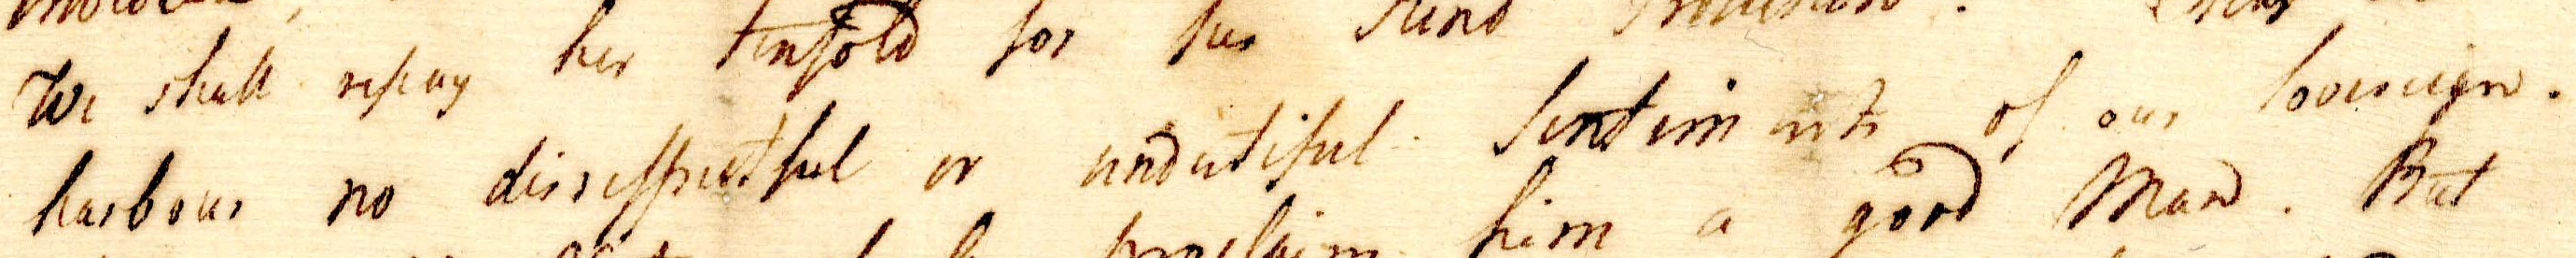harbour no disrespectful or undutiful Sentiment of our Sovereign
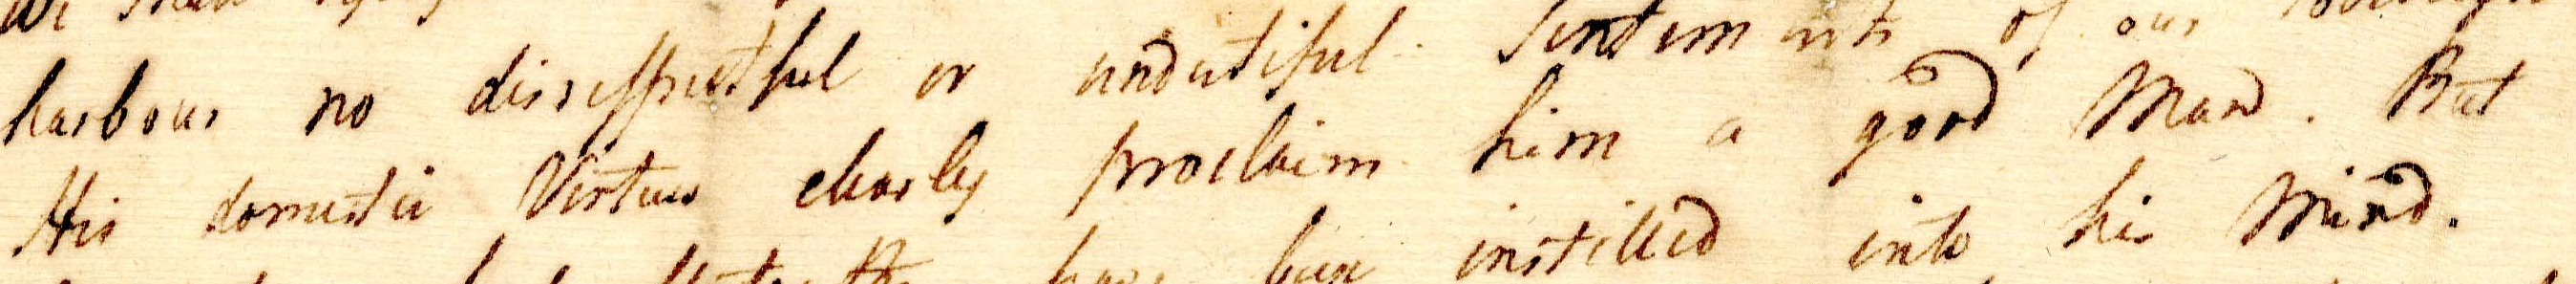His domestic Virtues chasly proclaim him a good Man. But
